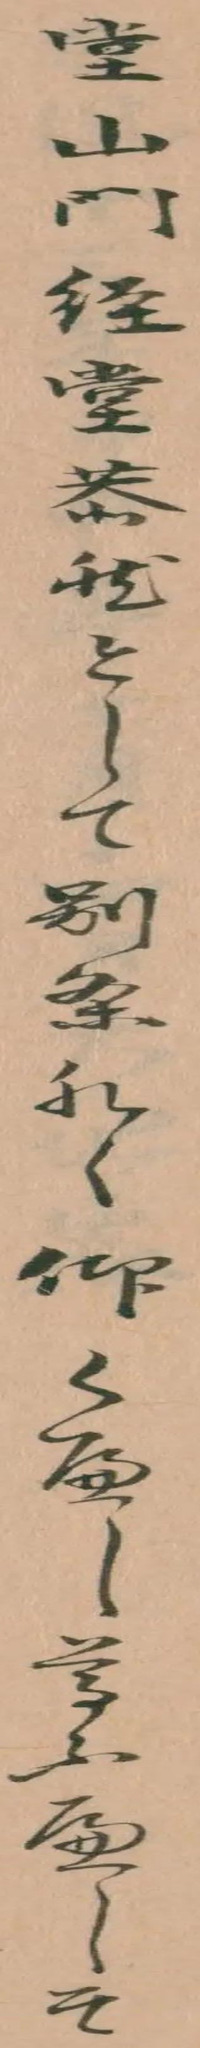堂山門経堂泰然として別状なし仰くへし尊ふへしそ
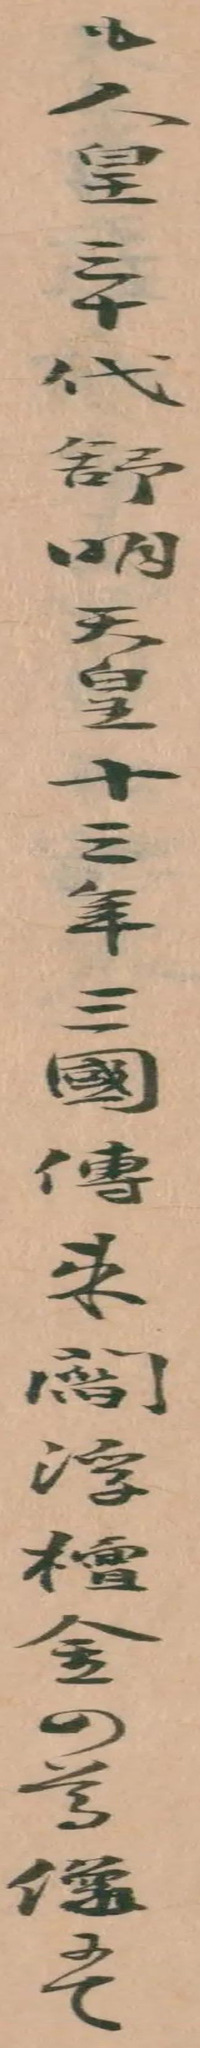も人皇三十代欽明天皇十三年三国伝来閻浮檀金の尊像にて
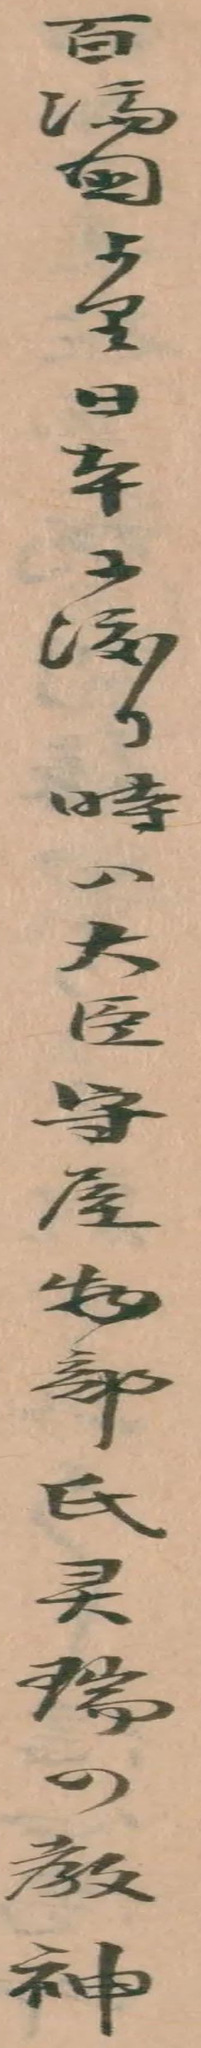百済国より日本に渡り時の大臣守屋物部氏異端の教神
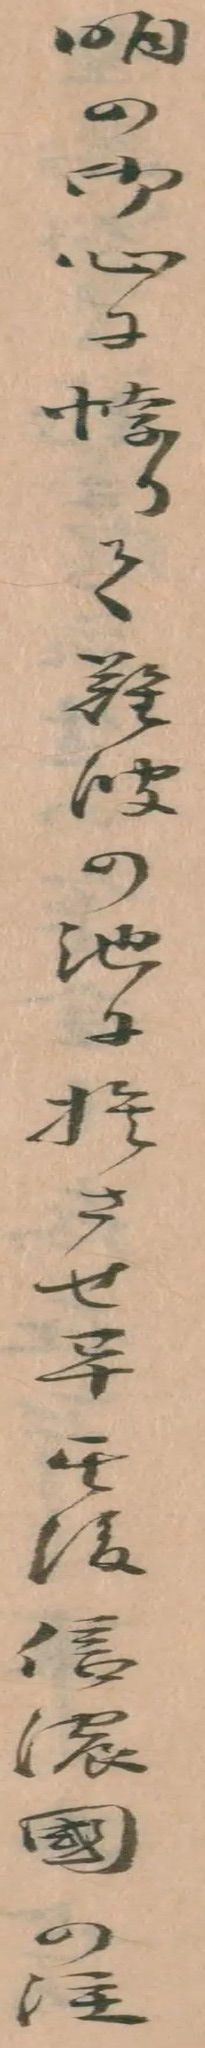明の御心に憚りて難波の池に捨させ畢其後信濃国の住
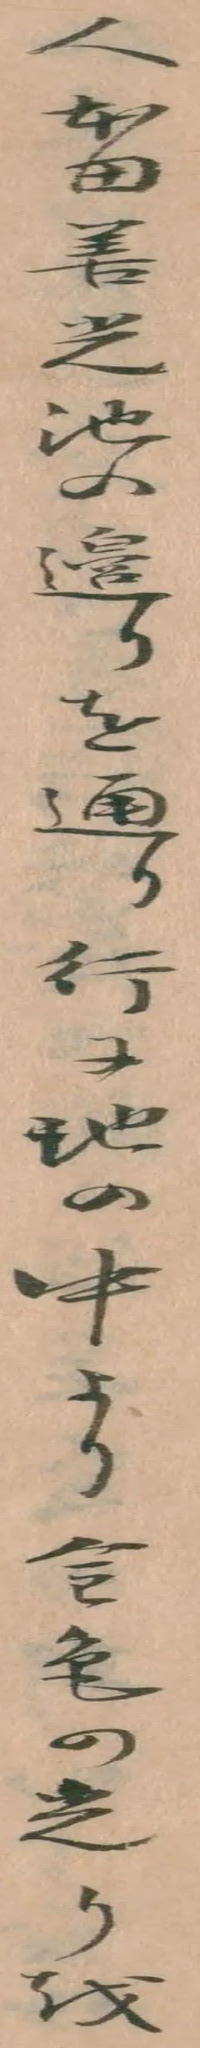人本田善光池の辺りを通り行に池の中より金色の光りを
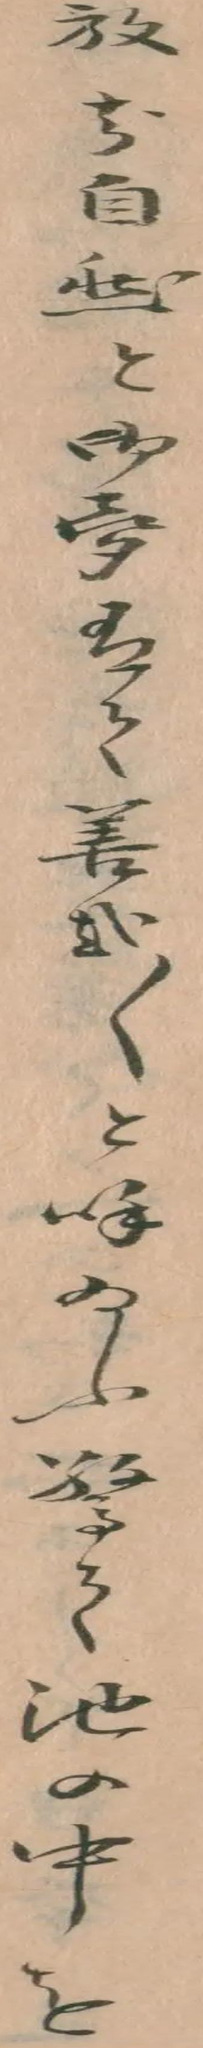放ち自然と御声有て善光くと呼給ふ驚て池の中を
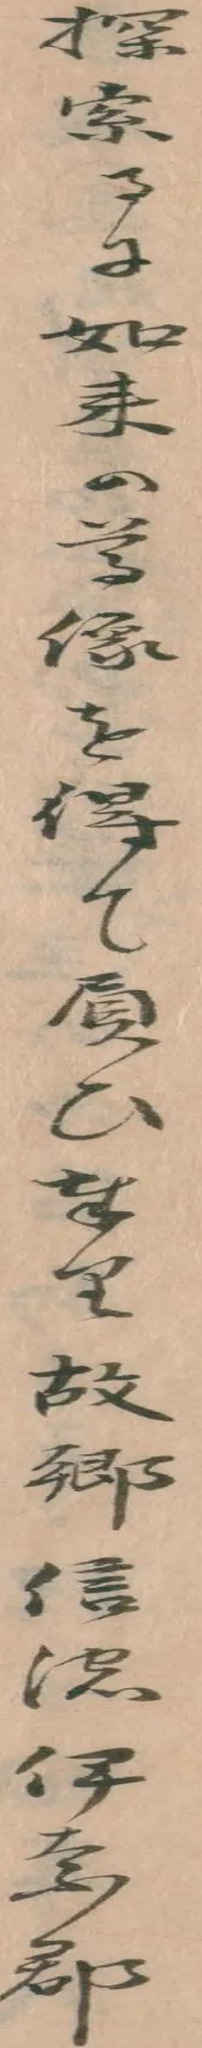探索るに如来の尊像を得て負ひ奉り故郷信濃伊奈郡
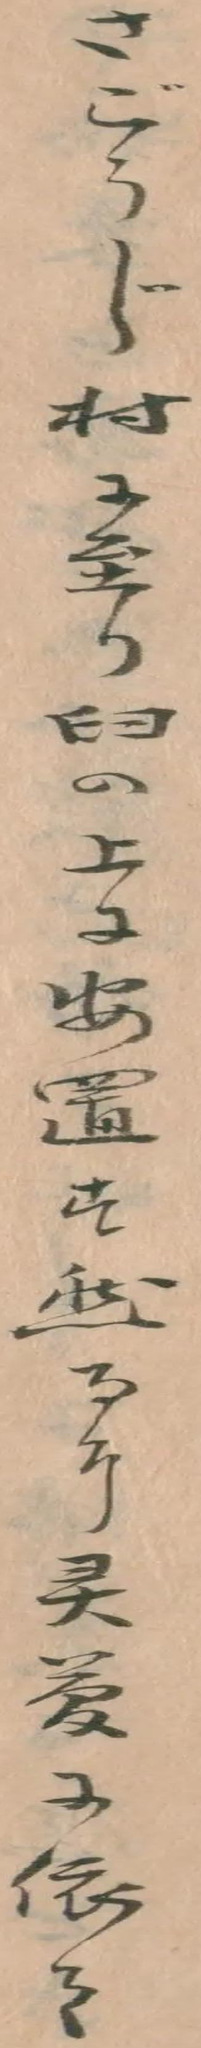ざこうじ村に至り臼の上に安置す然るに霊教に依て
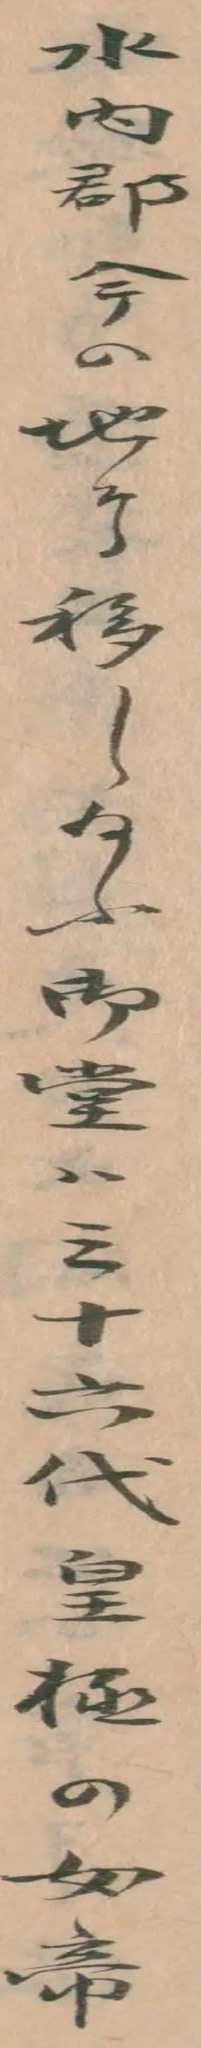水内郡今の地に移し給ふ御堂ハ三十六代皇極の女帝

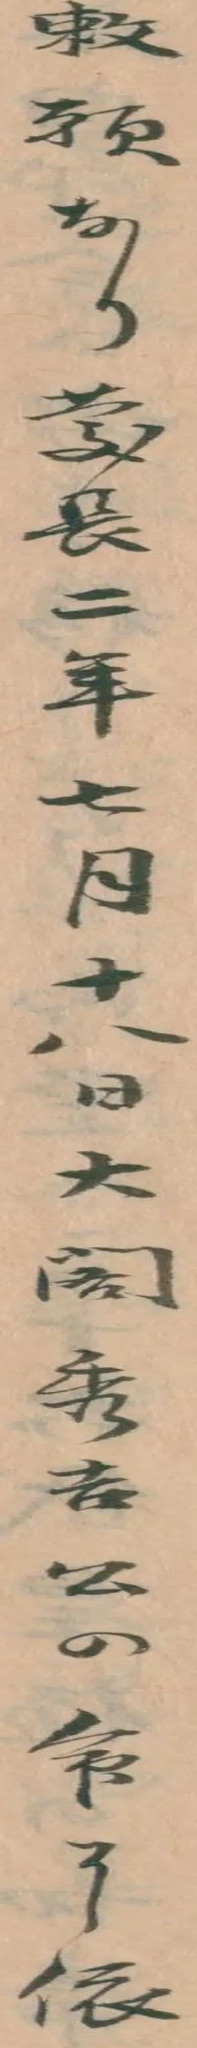勅願なり慶長二年七月十八日太閤秀吉公の命に依
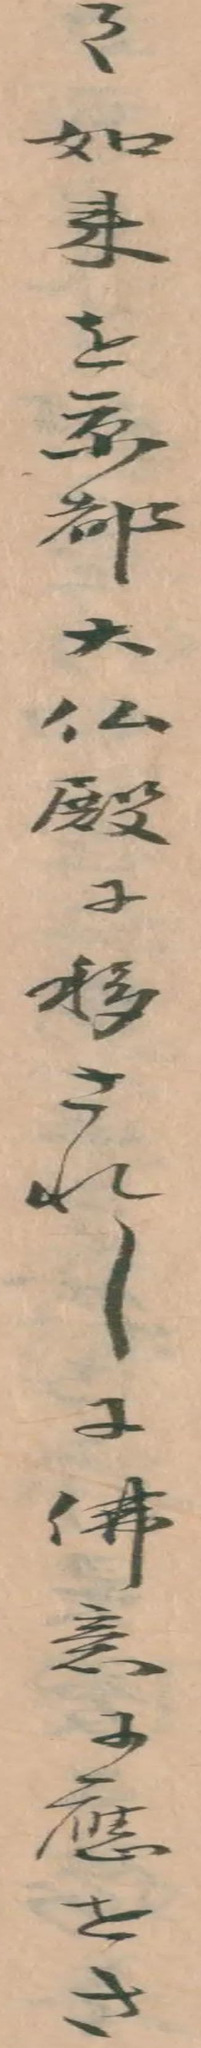て如来を京都大仏殿に移されしに仏意に応さす
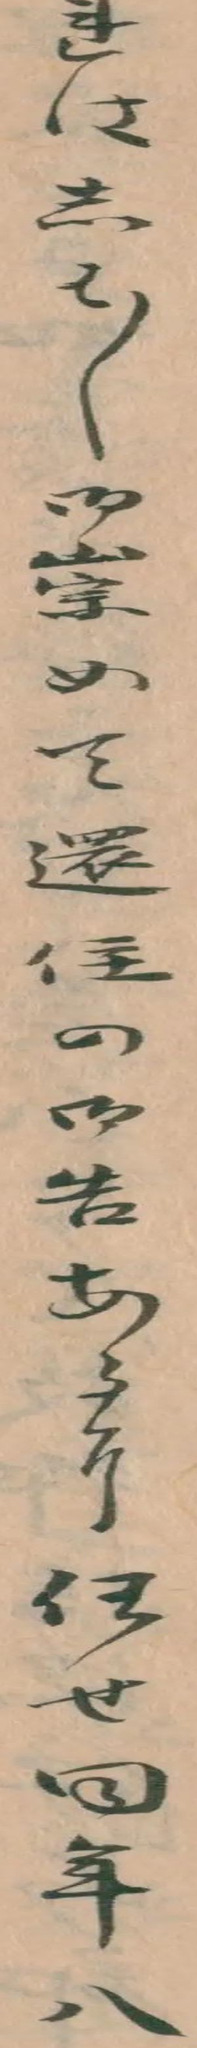れはしばしば御崇めて還住の御告あるに任せ同年八
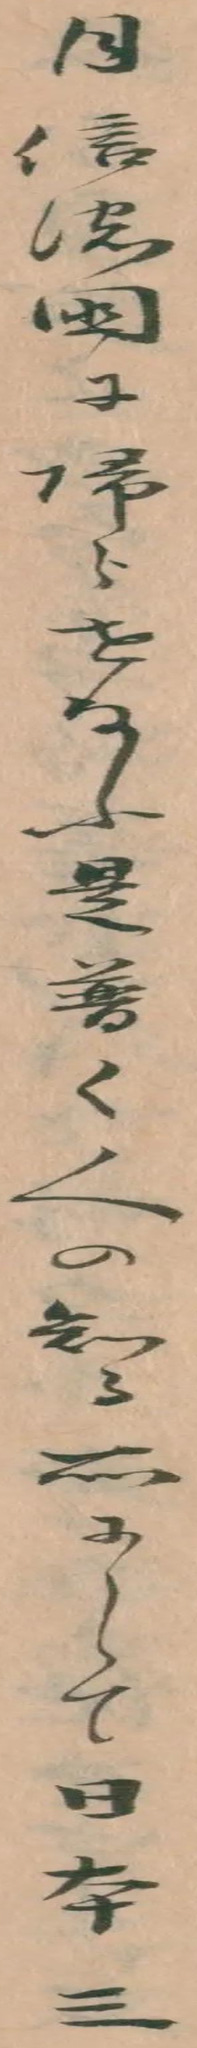月信濃国に帰らせ給ふ是普く人の知る所にて日本三
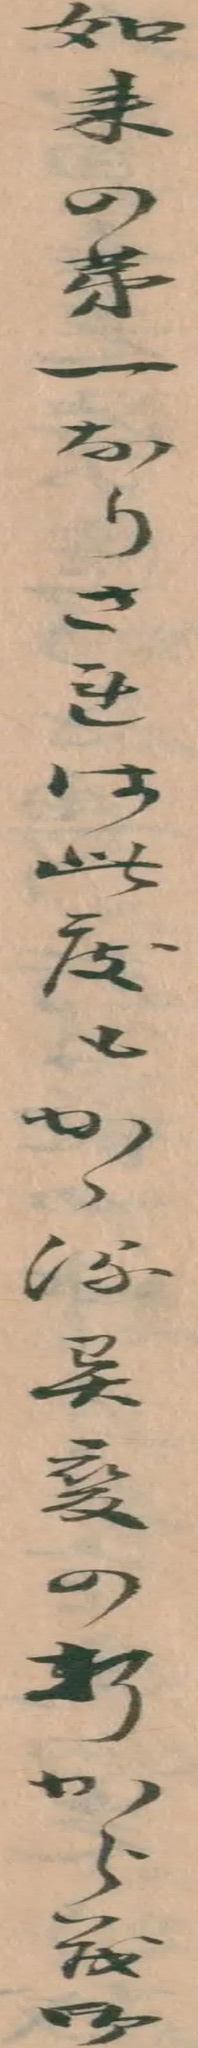如来の第一なりされハは此度もかゝる異変の折からも御
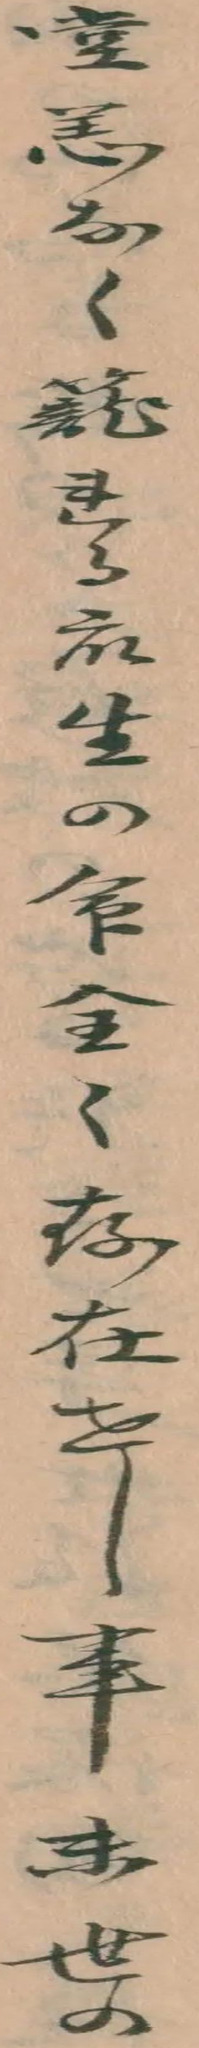堂恙なく籠れる衆生の命全く存在せし事末世の
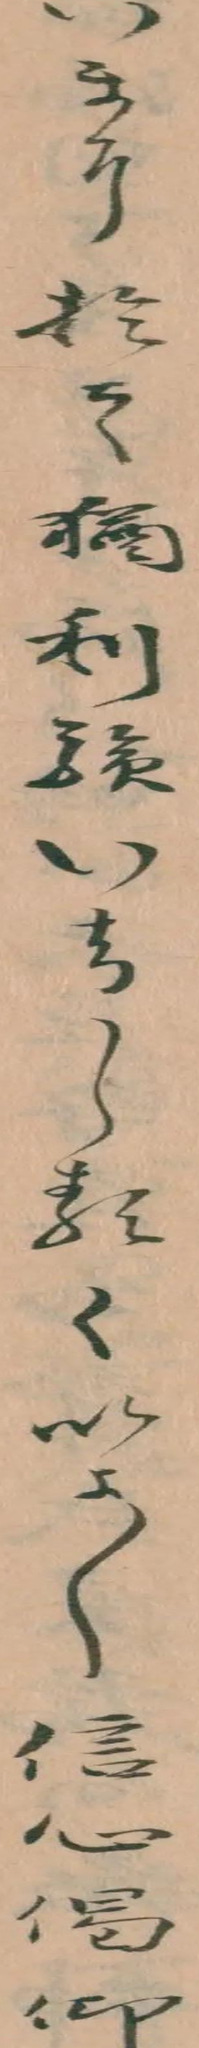いまに於て猶利験いちりしくいよいよ信心偈仰
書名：地災撮要. 巻3(地震之部)-巻4(噴火之部)
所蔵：国立国会図書館 National Diet Library, JAPAN
